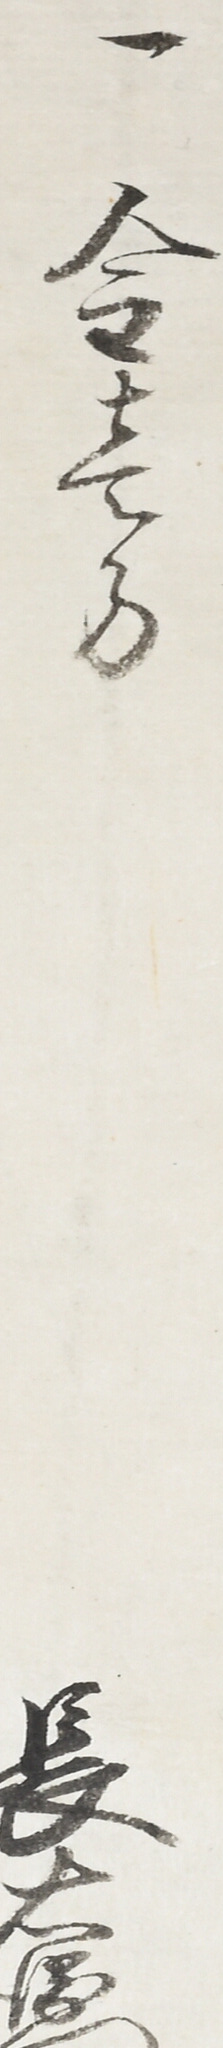一金壱分長右衛門

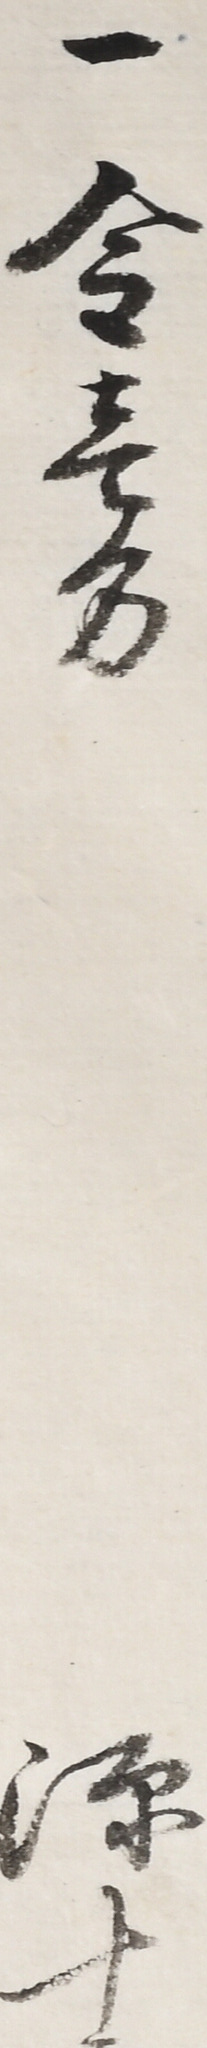一金壱分源十郎
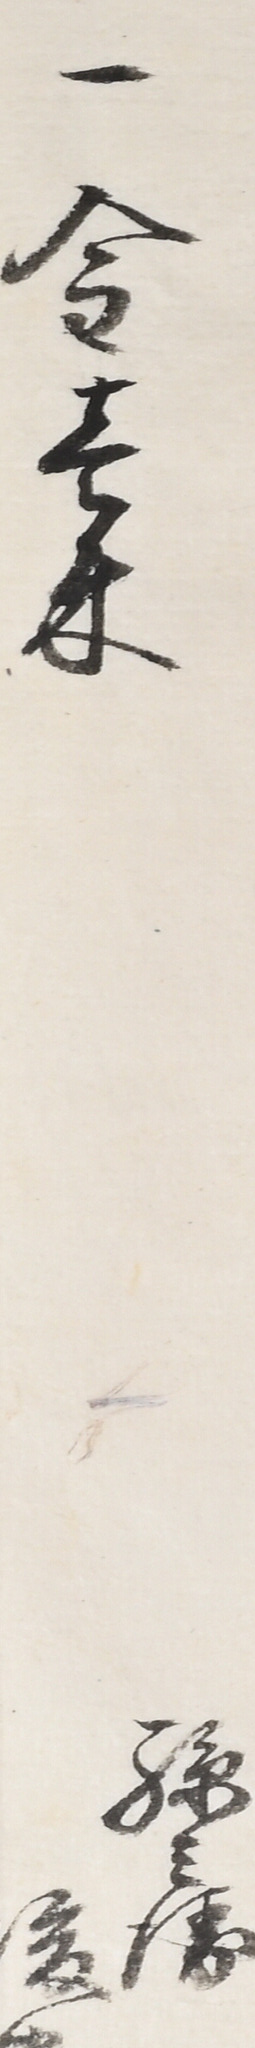一金壱朱孫兵衛
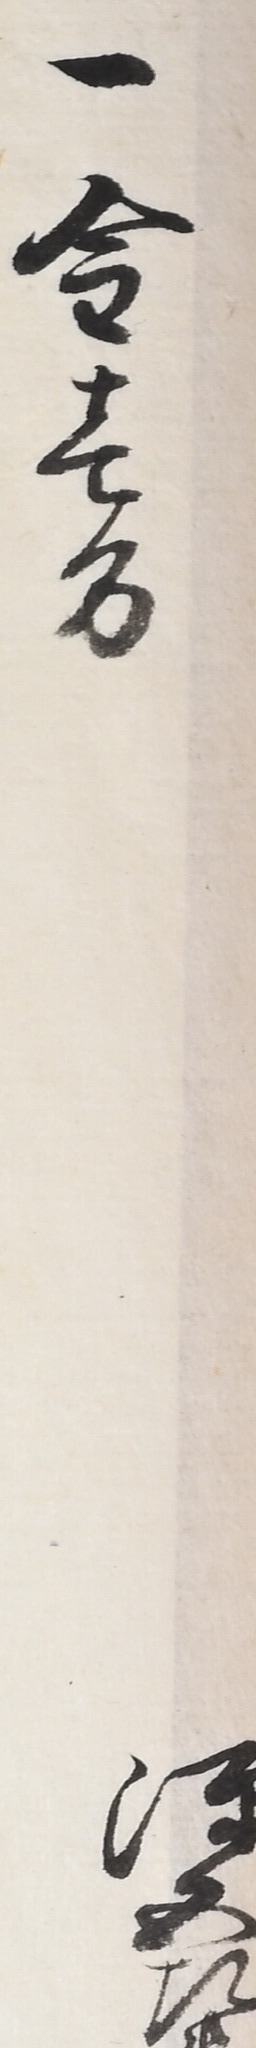一金壱分源十郎
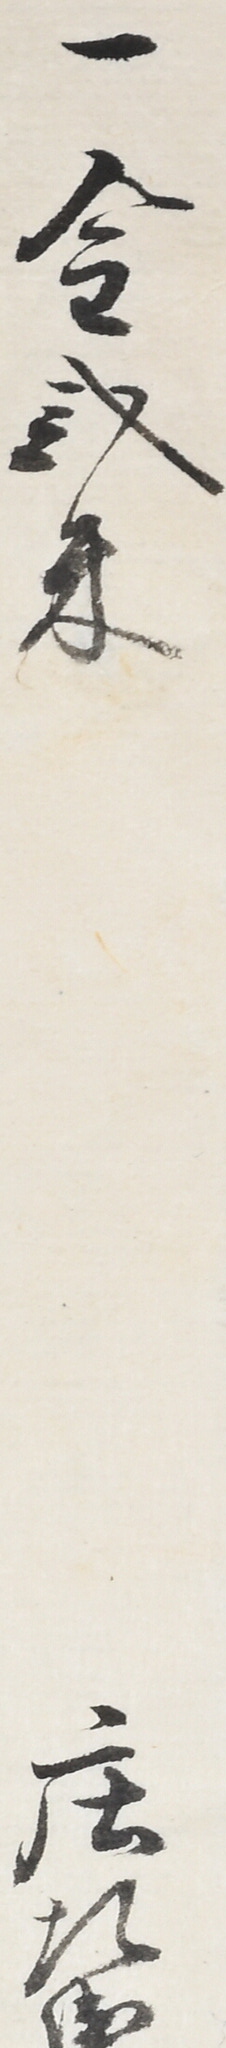一金弐朱庄左衛門
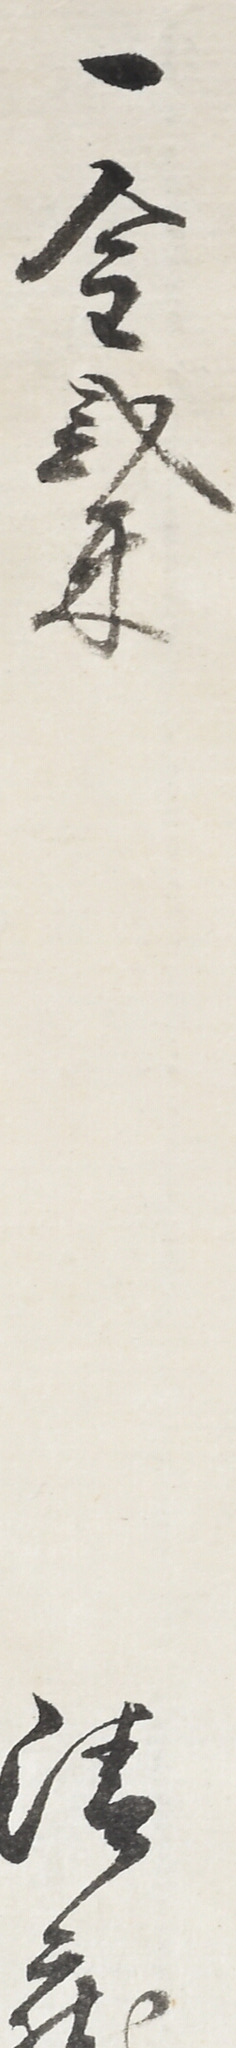一金弐朱清蔵
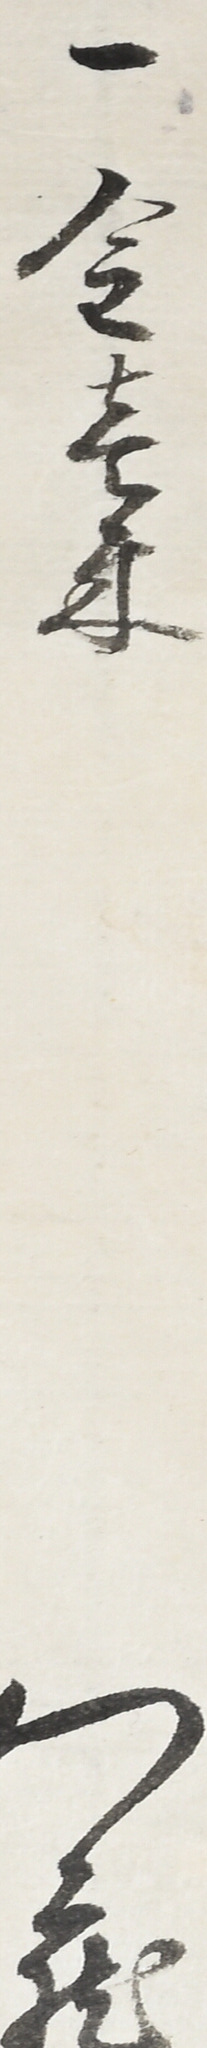一金壱朱郷蔵
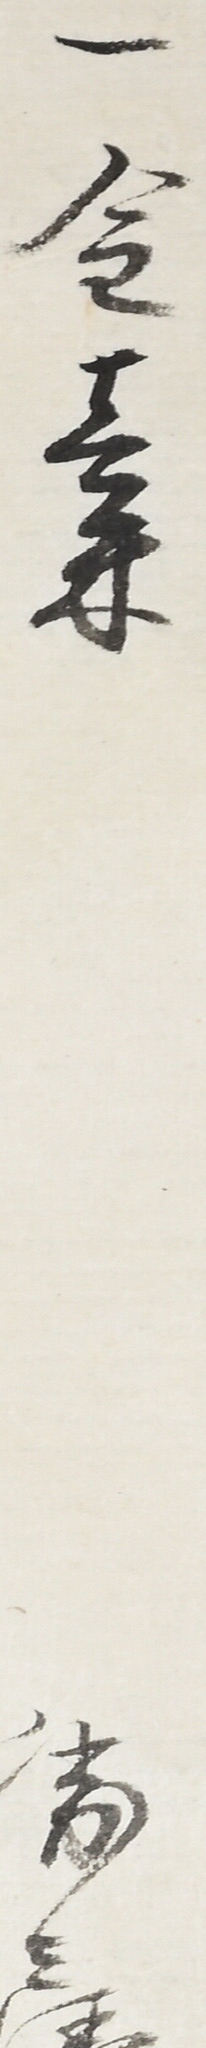一金壱朱勝兵衛

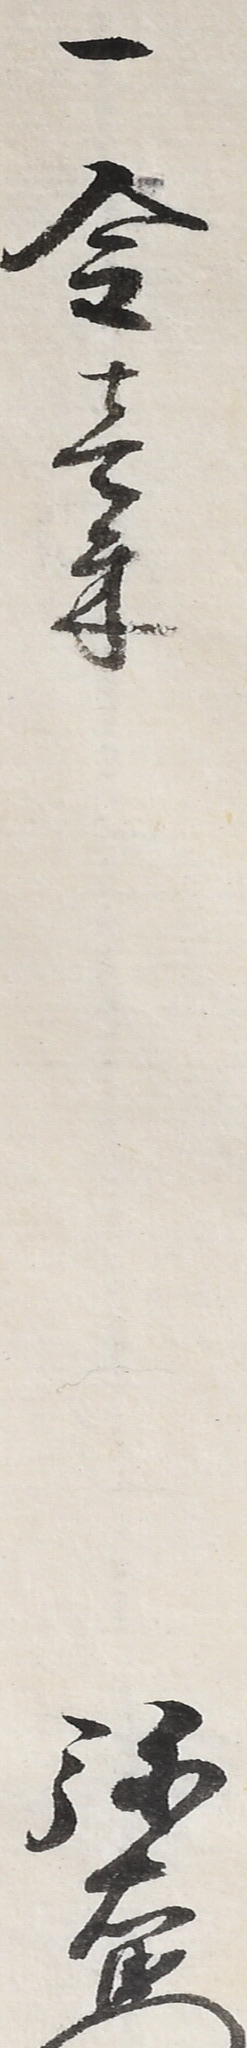一金壱朱弥右衛門
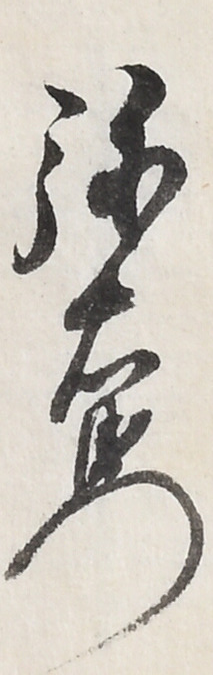忠右衛門
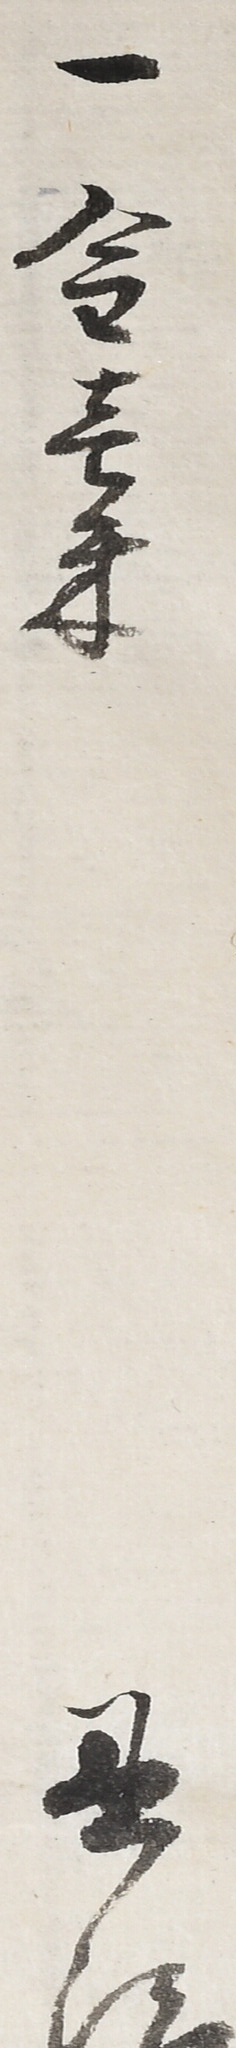一金壱朱丑治
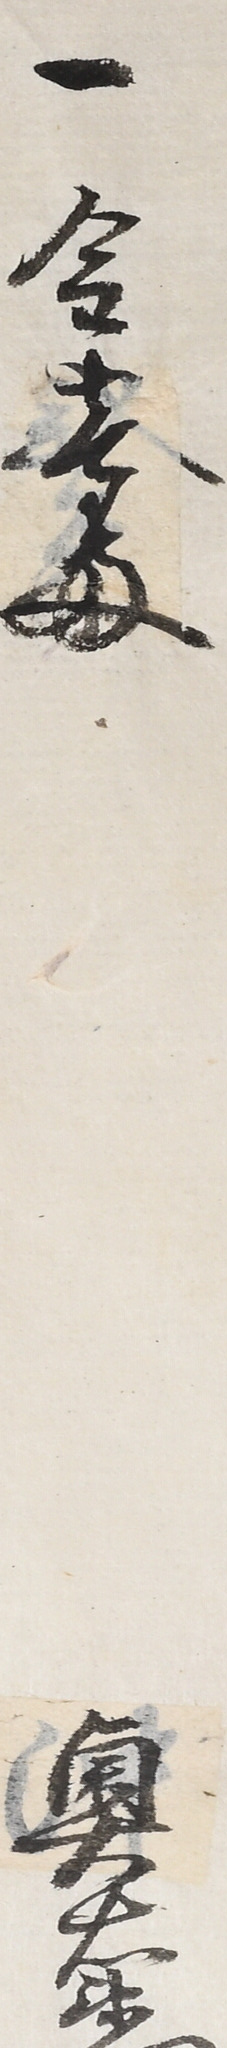一金壱両奥右衛門
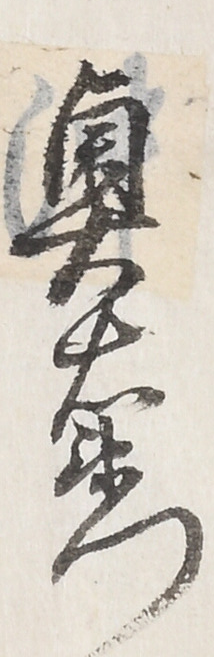忠右衛門
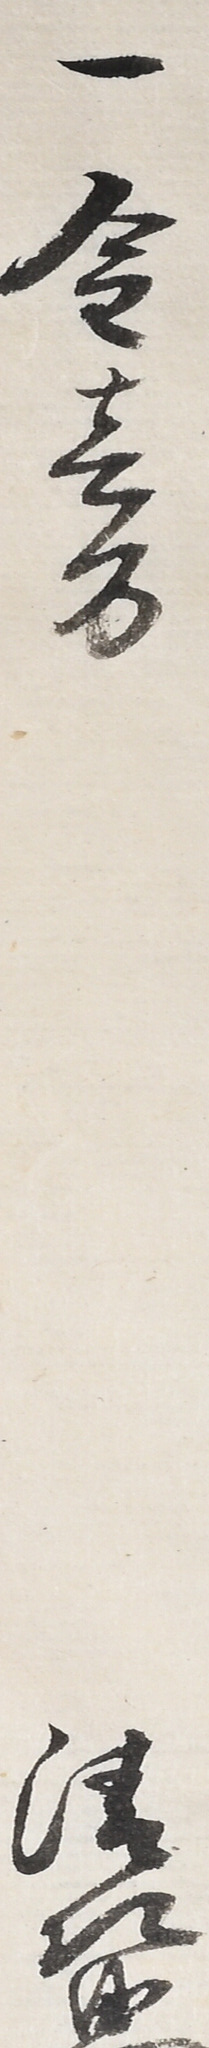一金壱分清左衛門
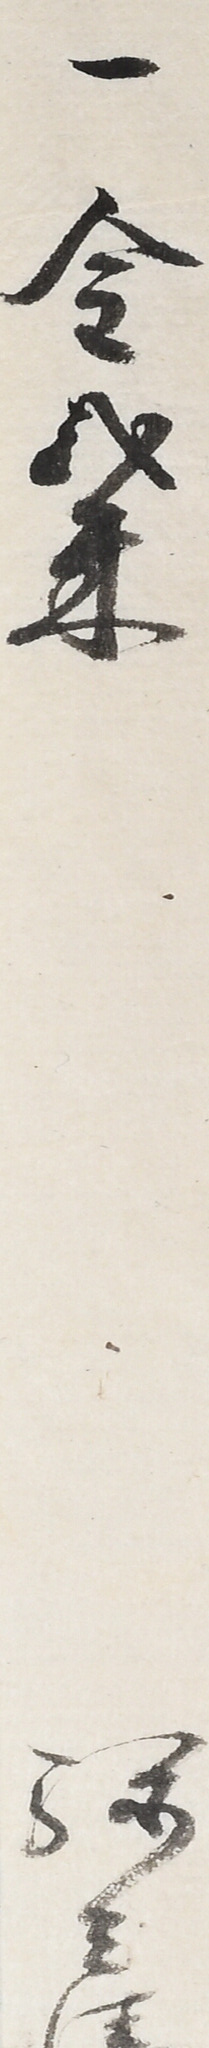一金弐朱弥兵衛
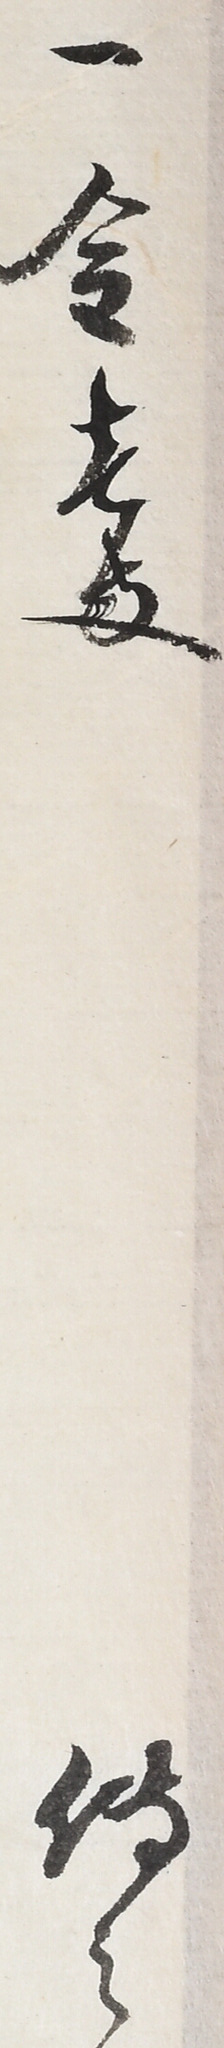一金壱両伝之丞
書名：御拝地百五拾年御祝儀献上御目録名前
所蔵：伊那市立高遠町図書館・合同会社AMANE
